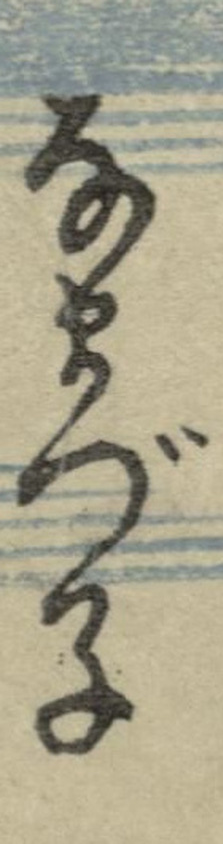なまづ子
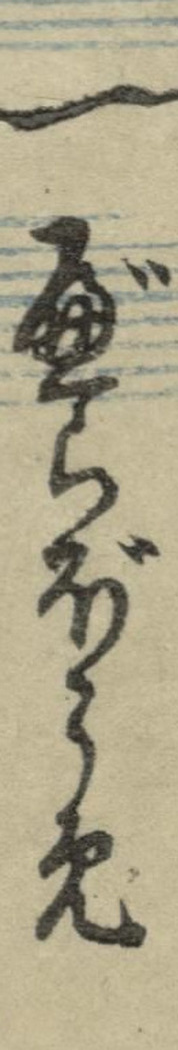〽べらぼうめ
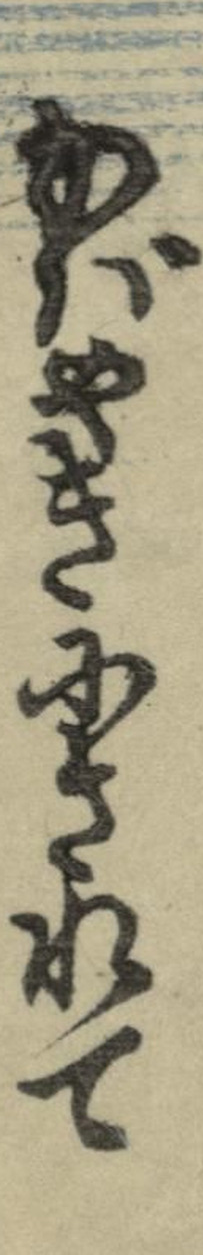かばやきにされて
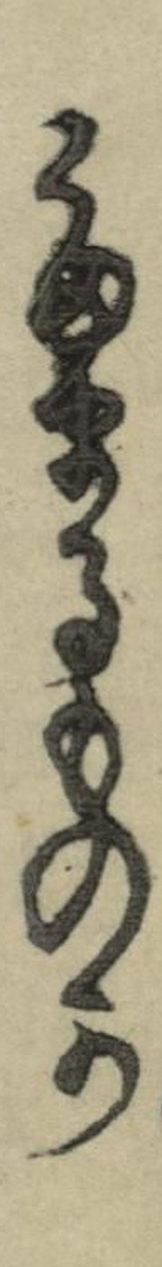たまるものか
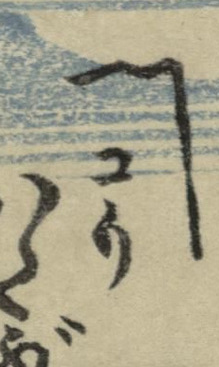〽コウ
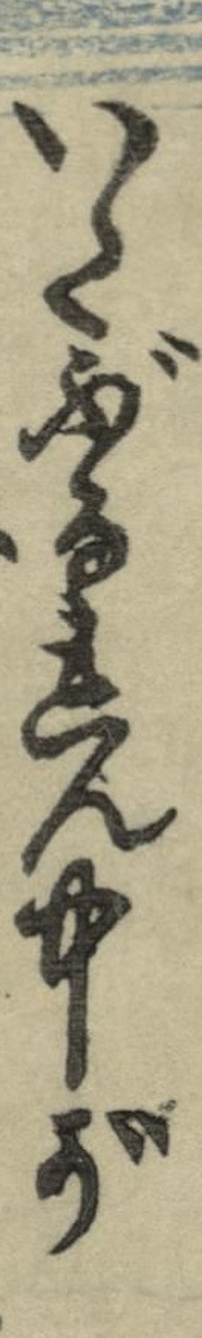いたぶるれん中が
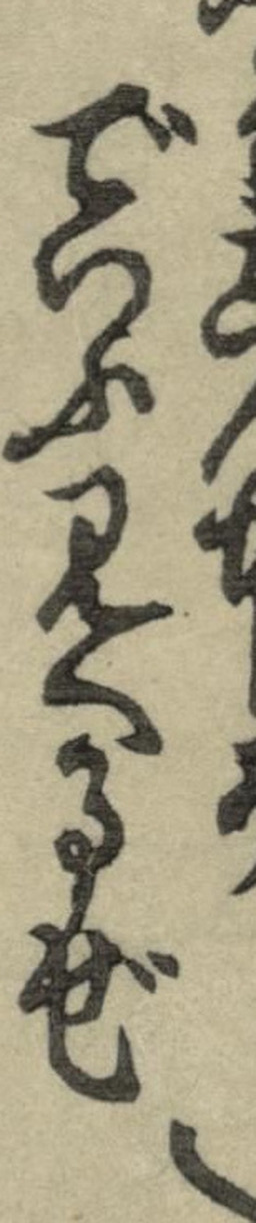でいふ見へるぜ
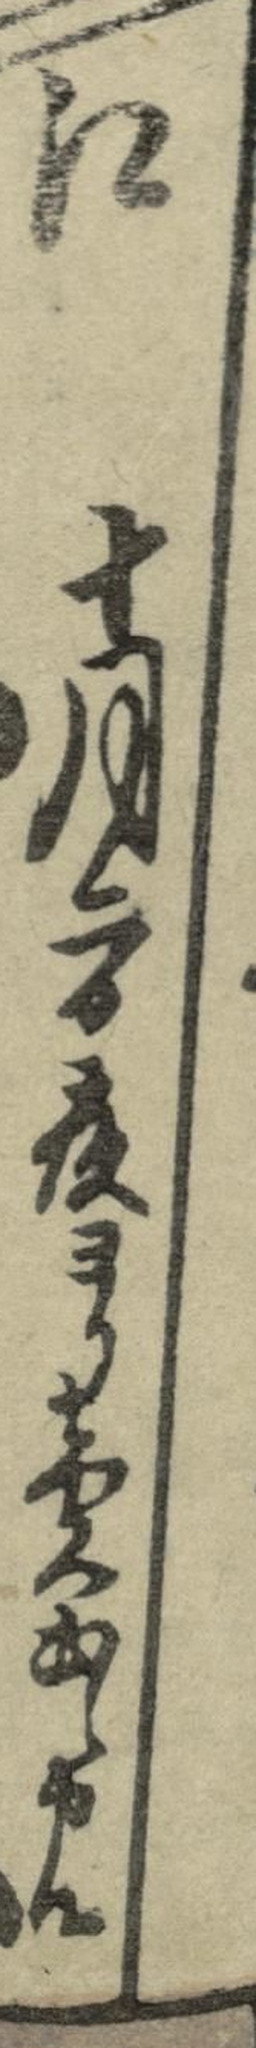江十月二日夜ヨリ売出し申候
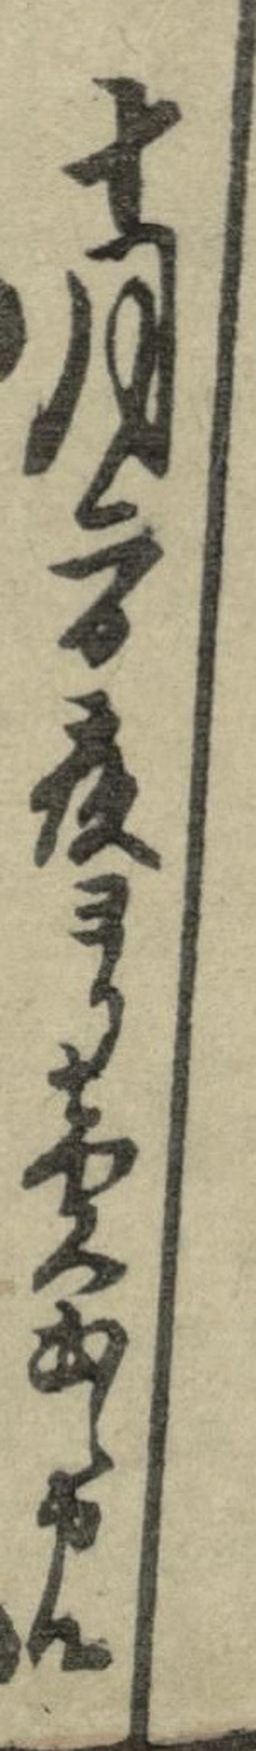江十月二日夜ヨリ売出し申候
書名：なんぢうやかぢ仮宅
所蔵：東京大学地震研究所図書室 Earthquake Research Institute Library, The University of Tokyo, JAPAN
